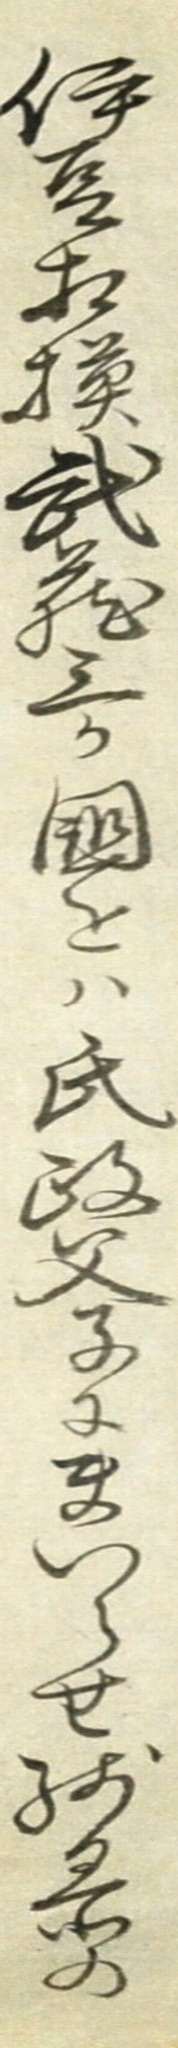伊豆相模武蔵三ゕ国をは氏政父子にまいらせ残る所の
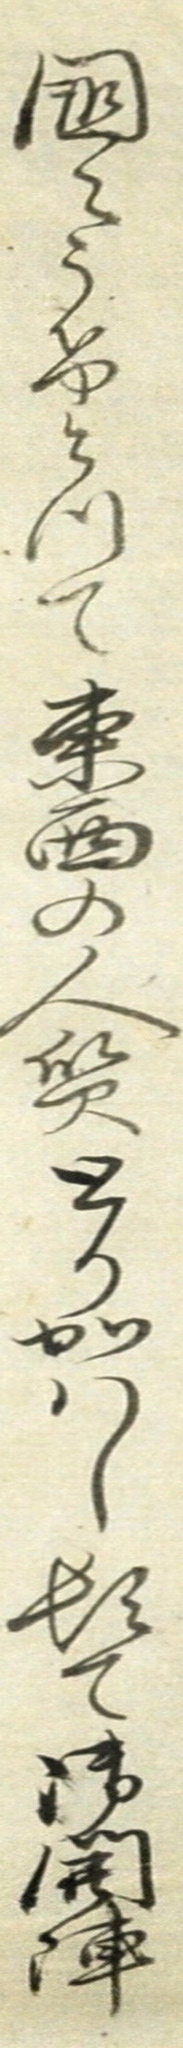国々うけとつて東西の人質とりかはし頓て御開陣
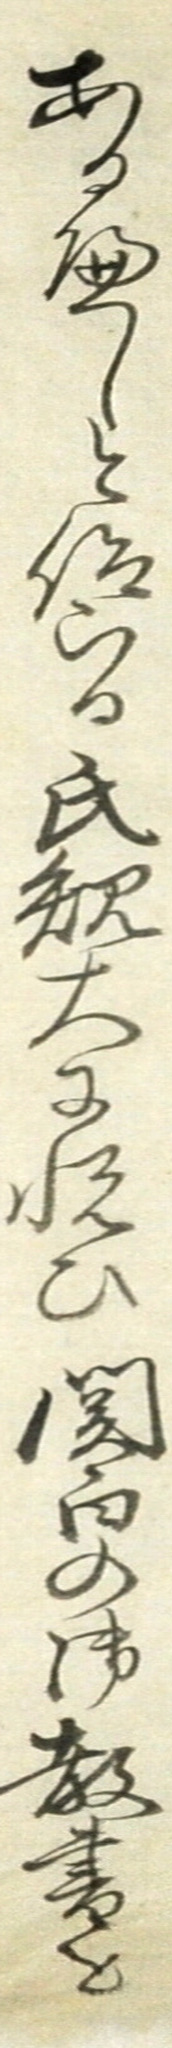あるへしと仰らる氏規大に悦ひ関白の御教書を
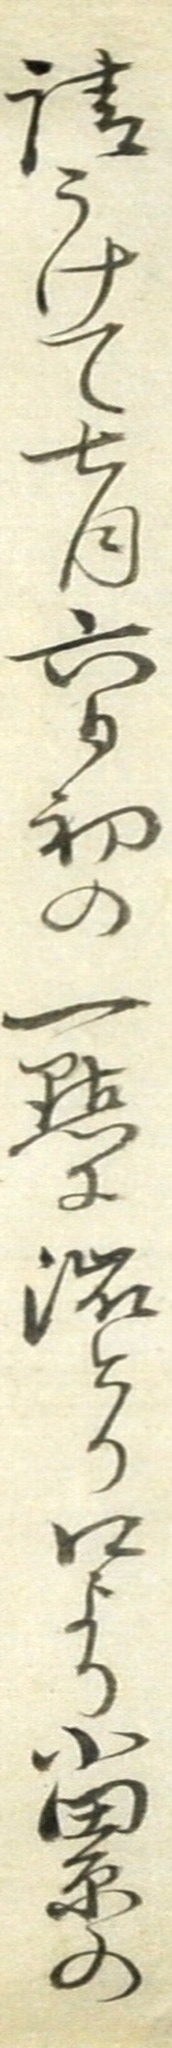請うけて七月六日初の一点に渋とり口より小田原の
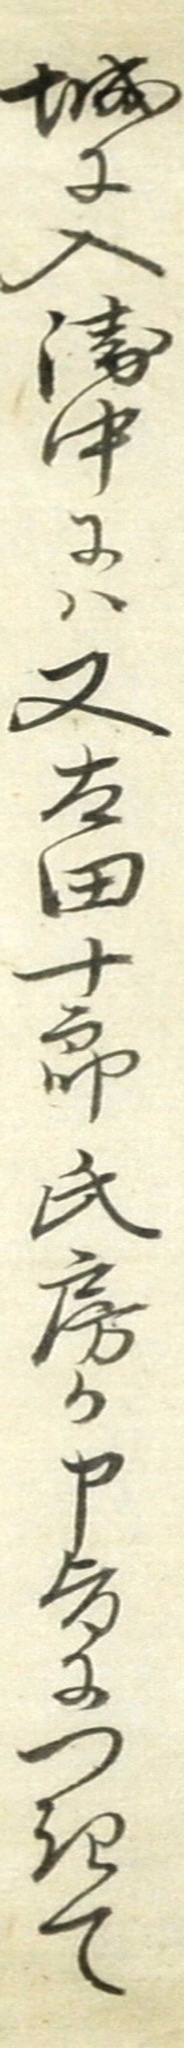城に入衛中には又太田十郎氏房か申旨につきて
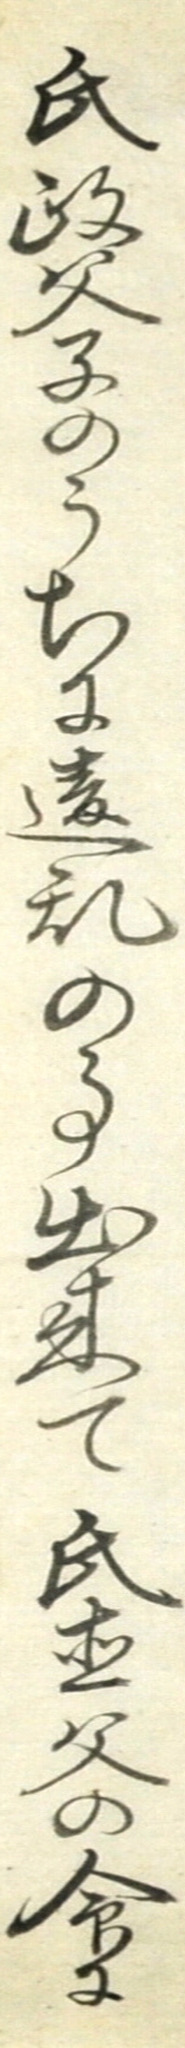氏政父子のうちに違乱の事出来て氏直父の命に
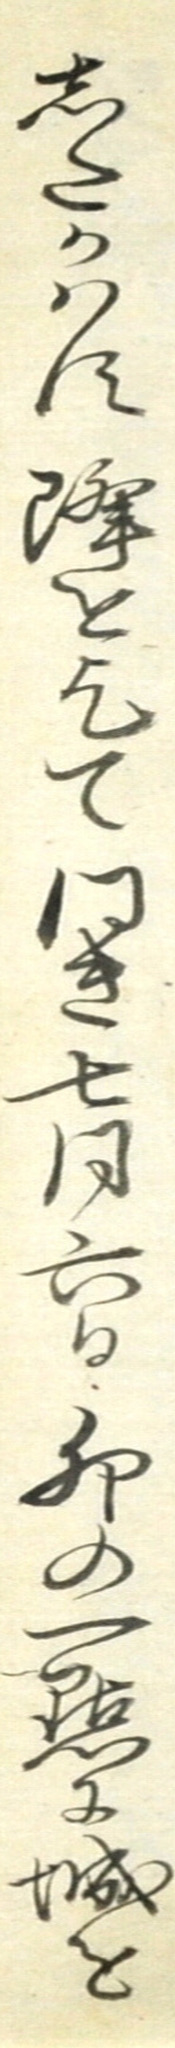したかはす降を乞て同き七月六日外の一点に城を
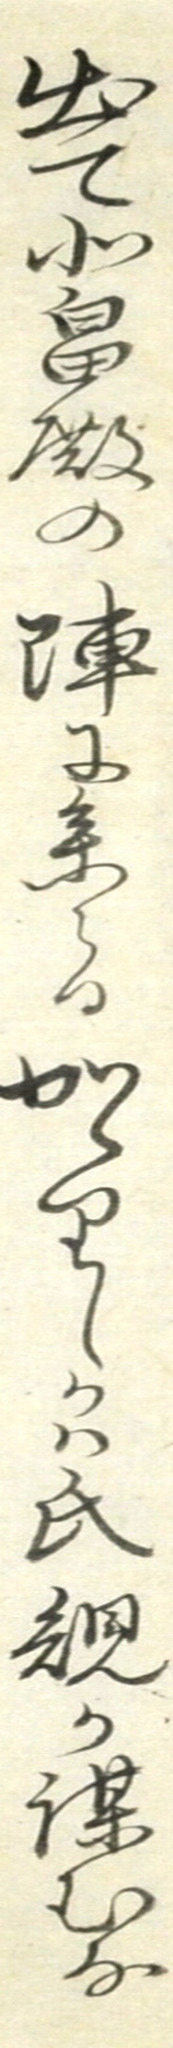出て北畠殿の陣に参らるかゝりしかは氏規か謀むな
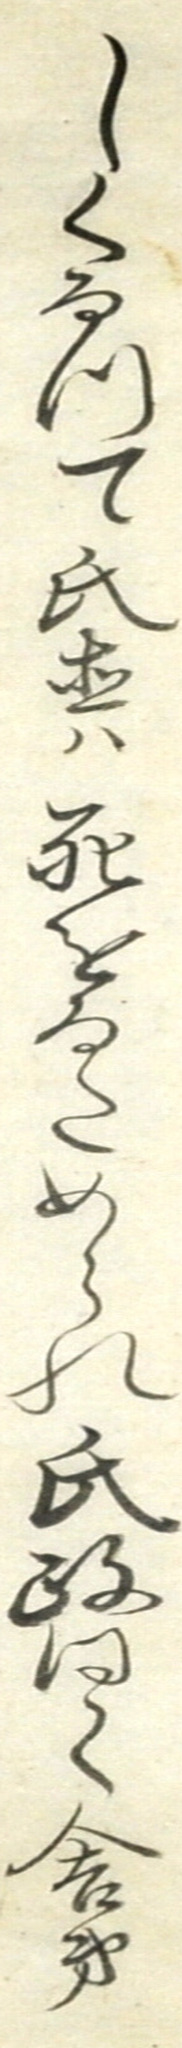しくなつて氏直は死をなためられ氏政同く舎弟
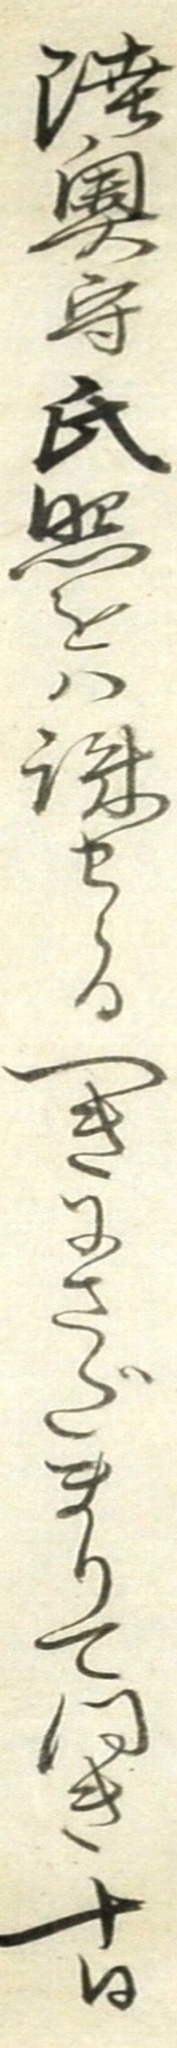陸奥守氏照をは誅せらるへきにさだまりて同き十日
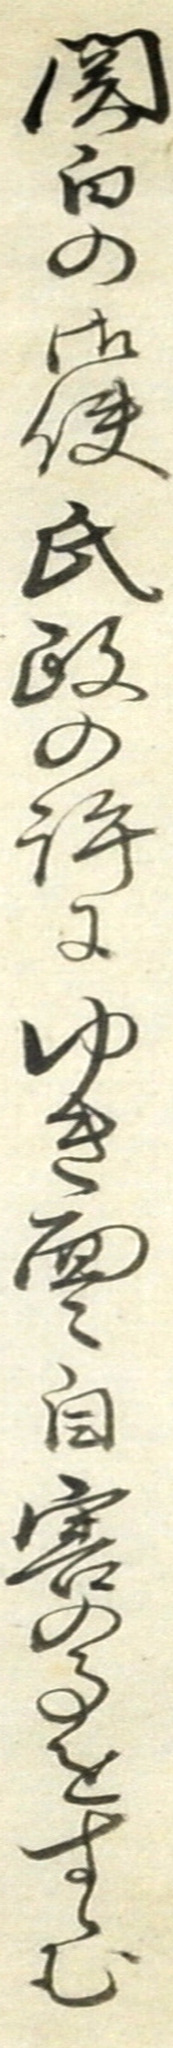関白の御使氏政の許にゆき面々自害の事をすゝむ
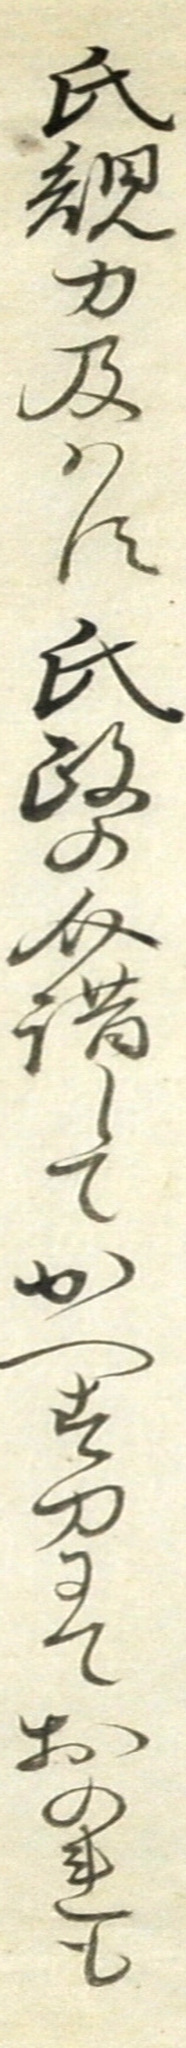氏規力及はす氏政の介錯してかへす刀にておのれも
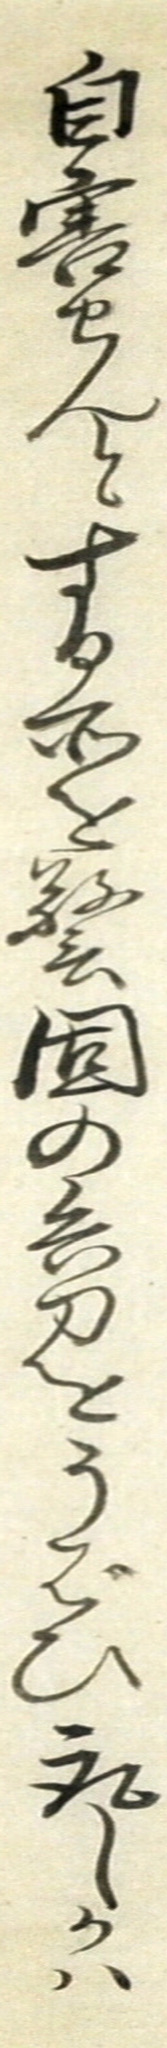自害せんとする所を警固の兵刀をうばひ死しかは
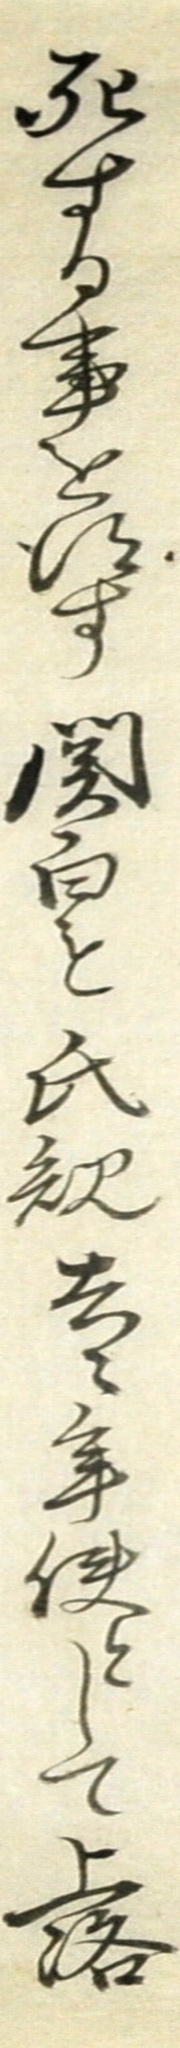死する事を得す関白も氏規去々年使として上洛
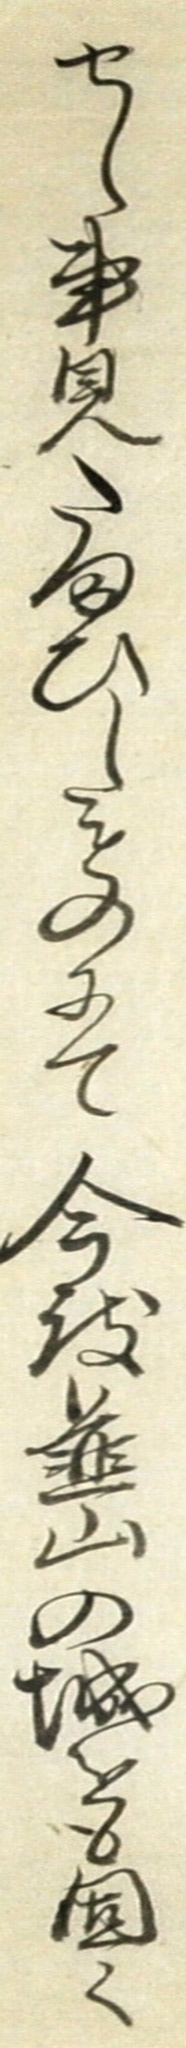せし事見たまひしものにて今度韮山の城をも固く
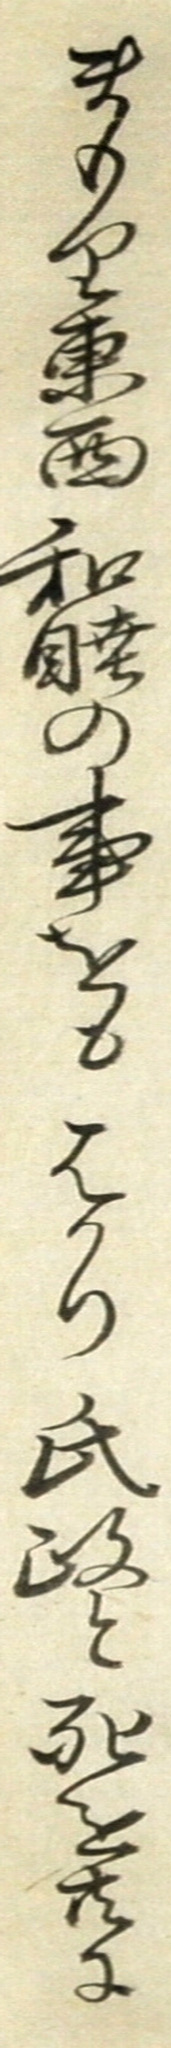まもり東西和睦の事をもはかり氏政と死を共に
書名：藩翰譜（六）
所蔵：伊那市立高遠町図書館・合同会社AMANE
